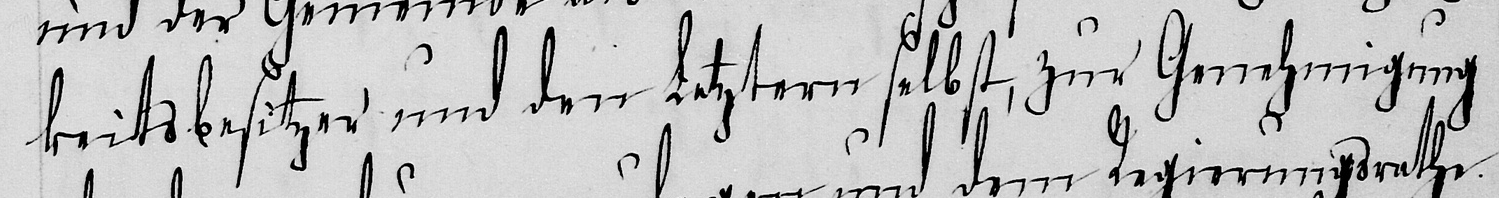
keitsbesitzer und den Letztern selbst, zur Genehmigung
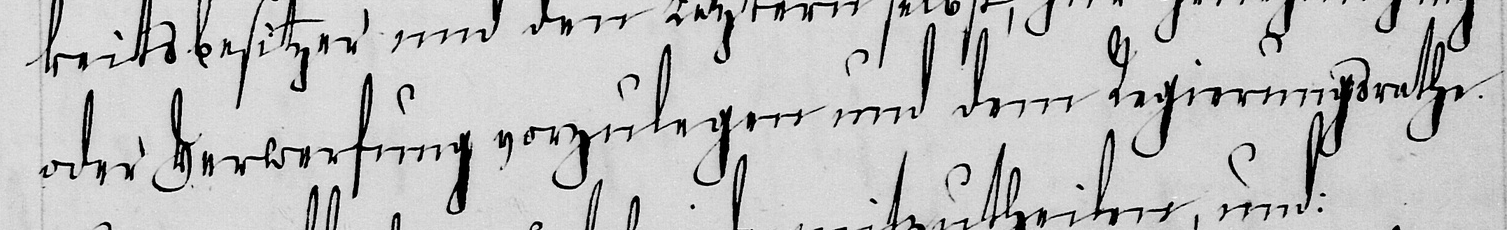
oder Verwerfung vorzulegen und dem Regierungsrathe
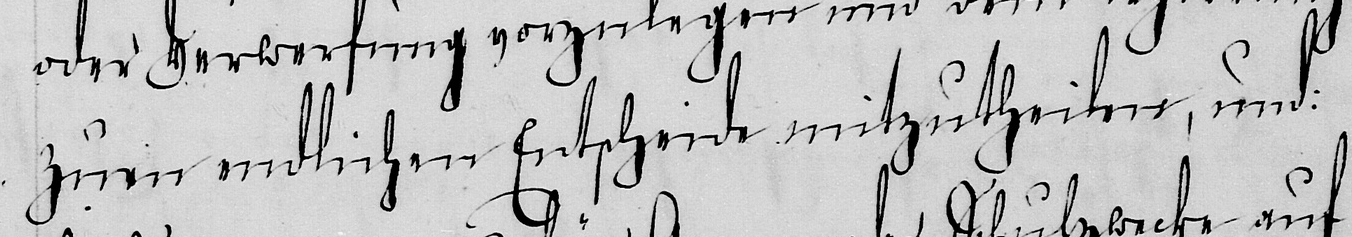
zum endlichen Entscheide mitzutheilen, und:
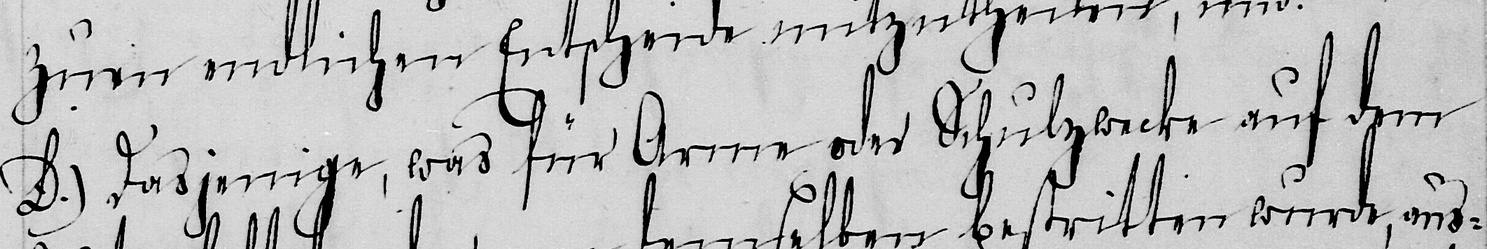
D.) Dasjenige, was für Arme oder Schulzwecke auf dem
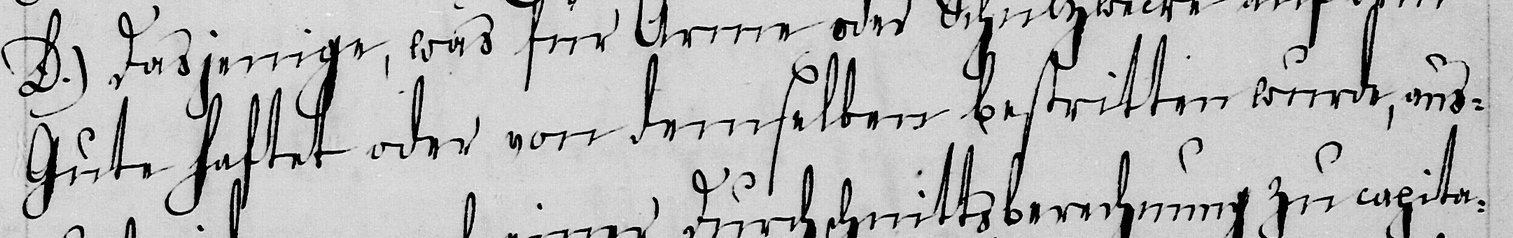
Gute haftet oder von demselben bestritten wurde, aus¬
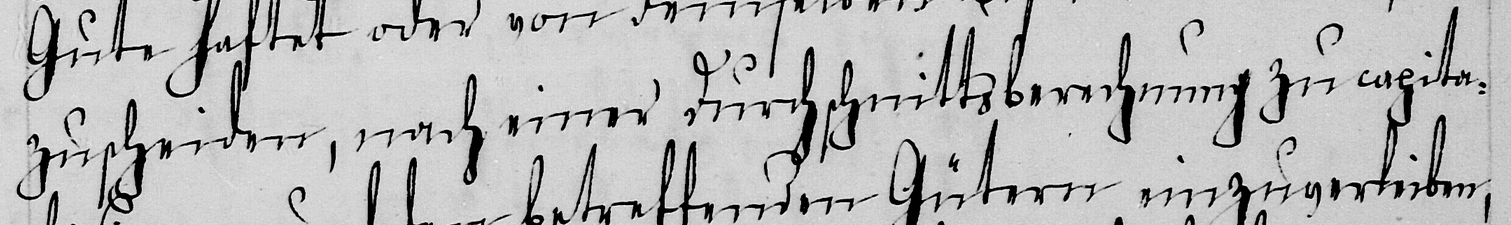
zuscheiden, nach einer Durchschnittsberechnung zu capita¬
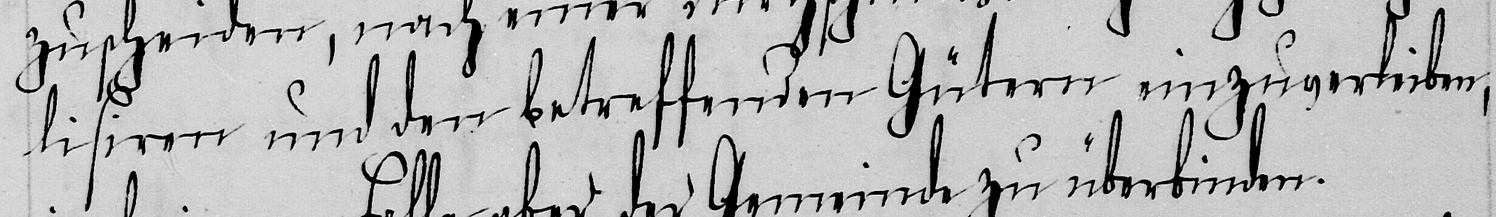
lisiren und den betreffenden Gütern einzuverleiben,
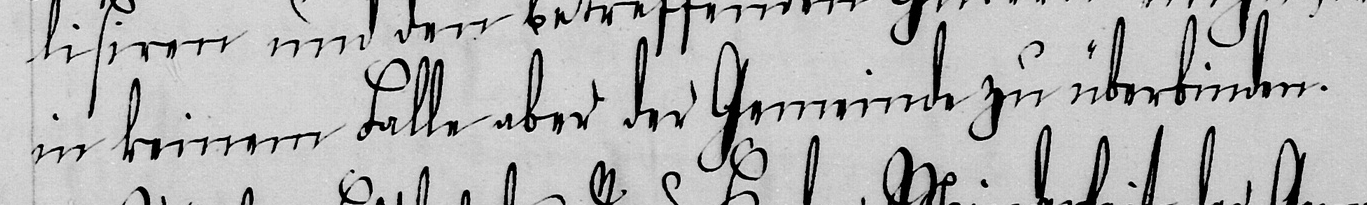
in keinem Falle aber der Gemeinde zu überbinden.
